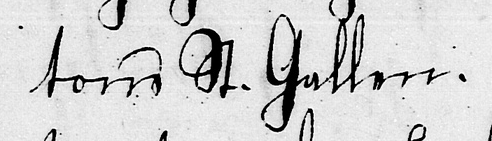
tons St. Gallen.
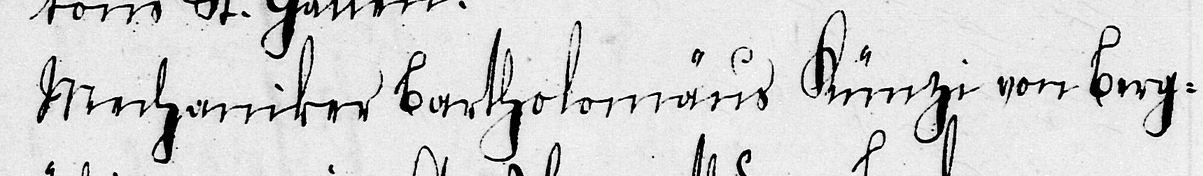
Mechaniker Bartholomäus Künzi von Berg¬
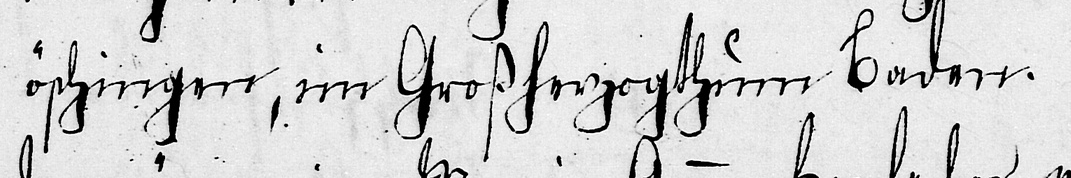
öschingen, im Großherzogthum Baden.
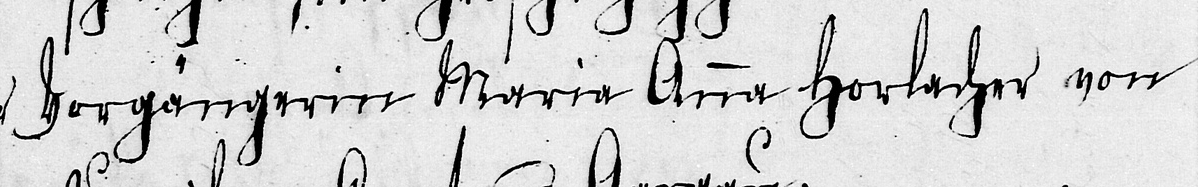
Vorgängerin Maria Anna Horlacher von
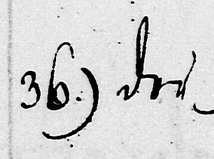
36.) Der
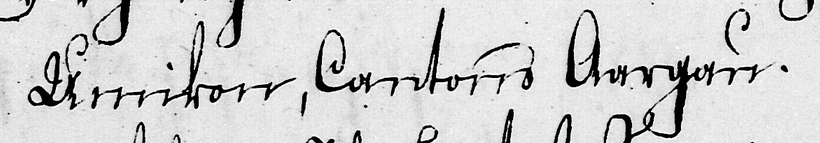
Umikon, Cantons Aargau.
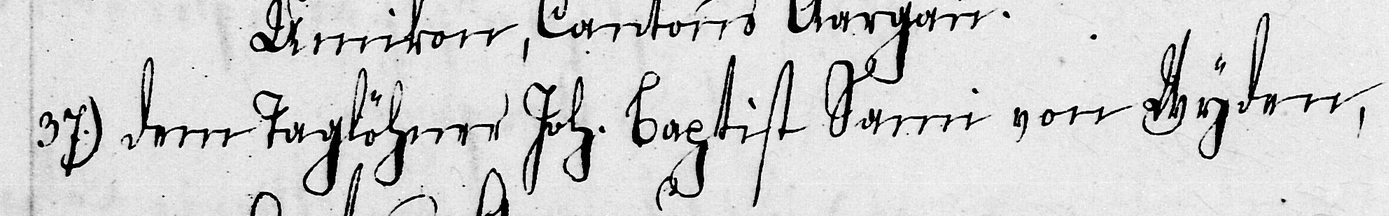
37.) Dem Taglöhner Joh. Baptist Sami von Wyden,
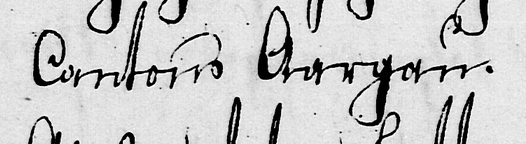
Cantons Aargau.
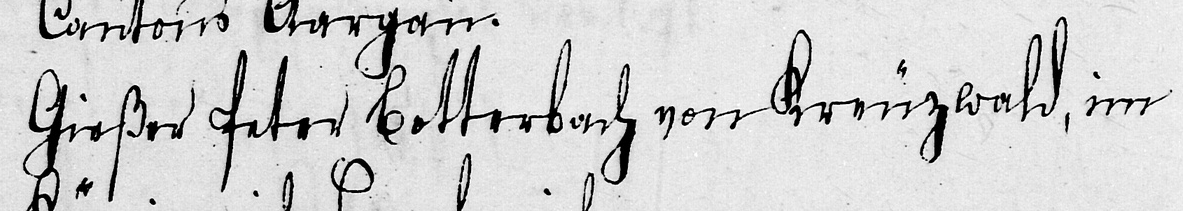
Gießer Peter Botterbach von Kreuzwald, im
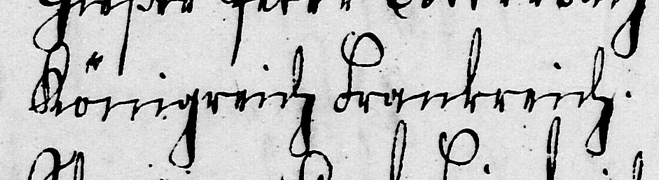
Königreich Frankreich.
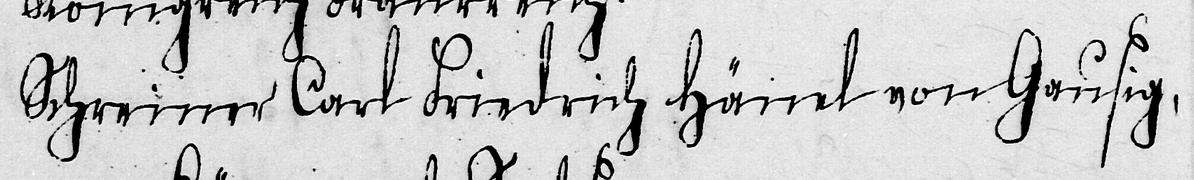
Schreiner Carl Friedrich Hänel von Gausig,
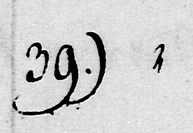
39.)
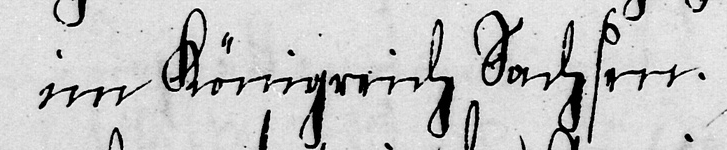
im Königreich Sachsen.
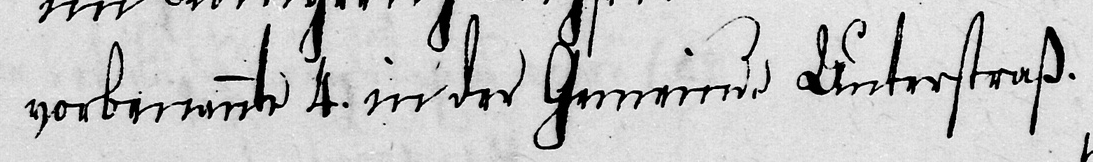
vorbenannte 4. in der Gemeinde Unterstraß.
